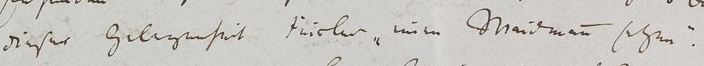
dieser Gelegenheit Finsler «einen Waidmann setzen».
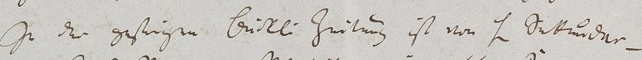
In der gestrigenBürkli Zeitung ist von H. Sekundar-
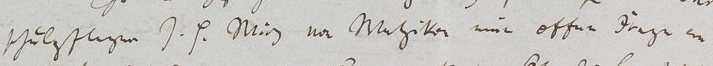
schulpflegerJ. P. Wirz von Wetzikon eine offene Frage an
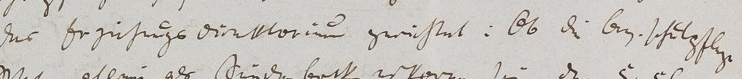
das Erziehungsdirektorium gerichtet: Ob die Bez.Schulpflege
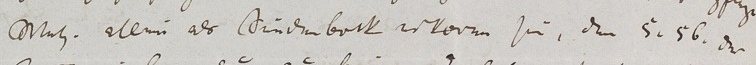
Wetz. allein als Sündenbock erkoren sei, den 5. 56. der
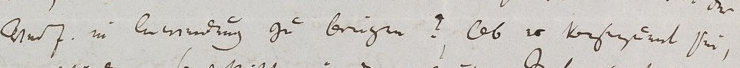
Verf. in Anwendung zu bringen? Ob es konsequent sei,
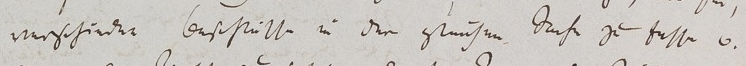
verschiedne Beschlüsse in der gleichen Sache zu fassen &.
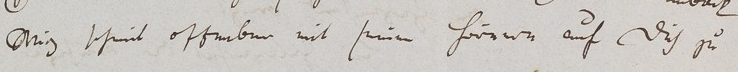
Wirz scheint offenbar mit seinen Hörnern auf Dich zu
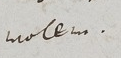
wollen.
